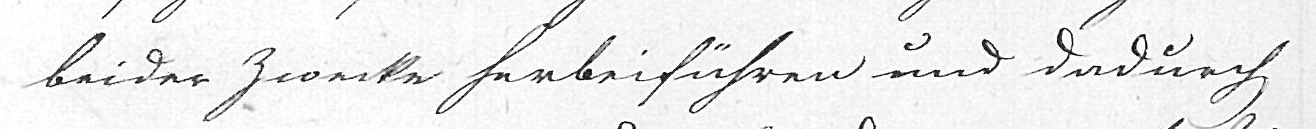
beiden Zwecke herbeiführen und dadurch
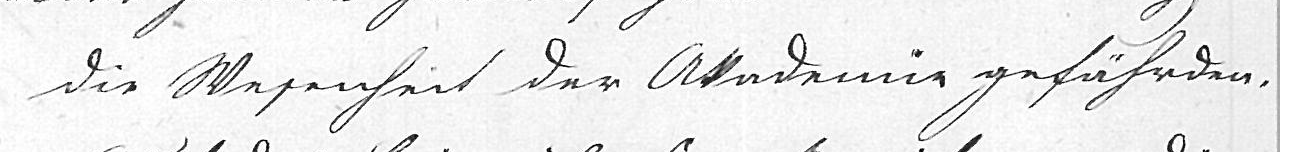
die Wesenheit der Akademie gefährden.
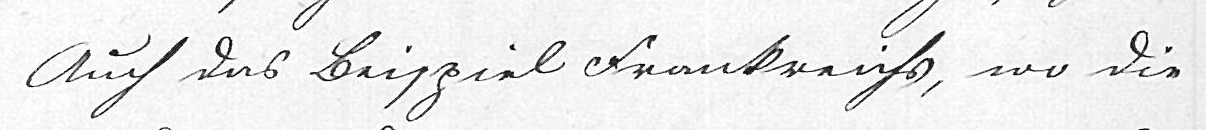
Auch das Beispiel Frankreich, wo die
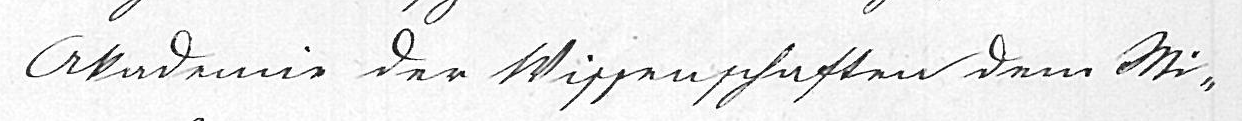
Akademie der Wissenschaften dem Mi-
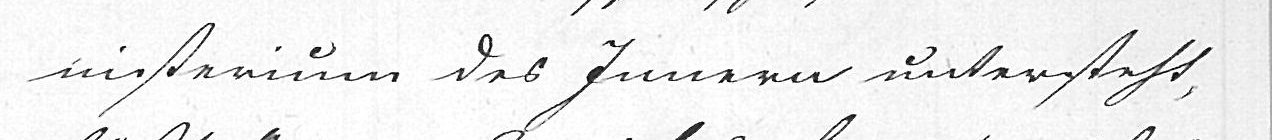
nisterium des Innern untersteht,
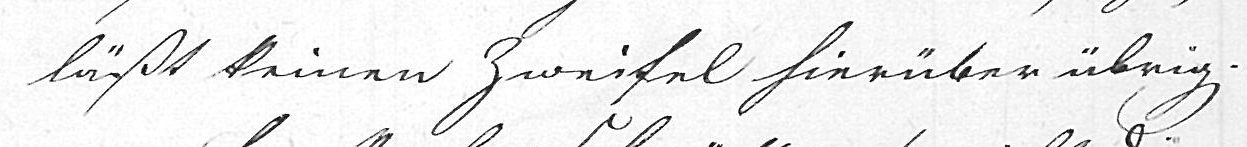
läßt keinen Zweifel hierüber übrig.
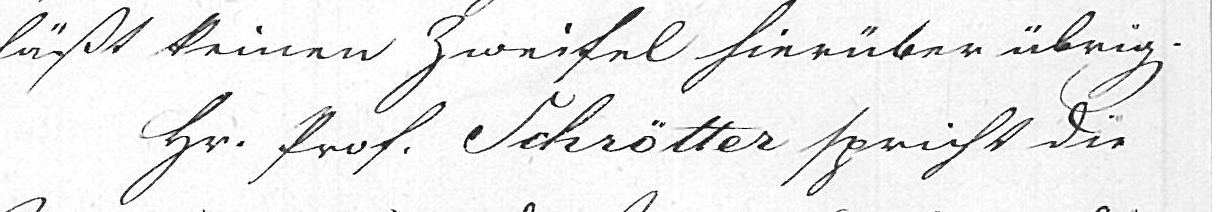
Hr. Prof. Schrötter spricht die
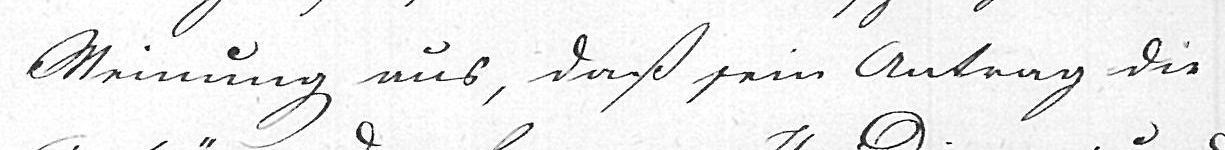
Meinung aus, daß sein Antrag die
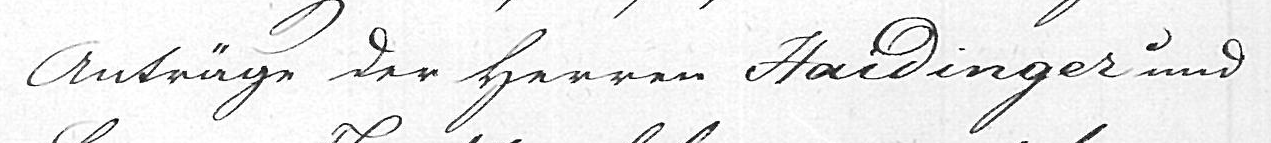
Anträge der Herren Haidinger und
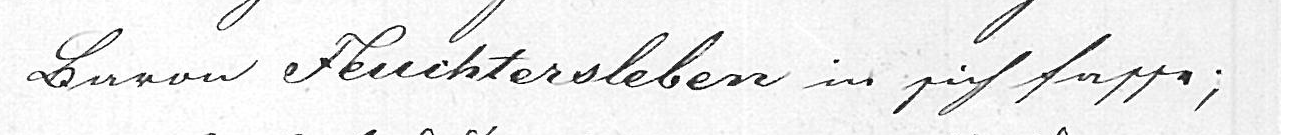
Baron Feuchtersleben in sich fasse;
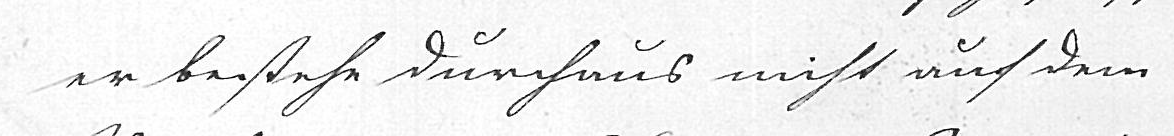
er bestehe durchaus nicht auf dem
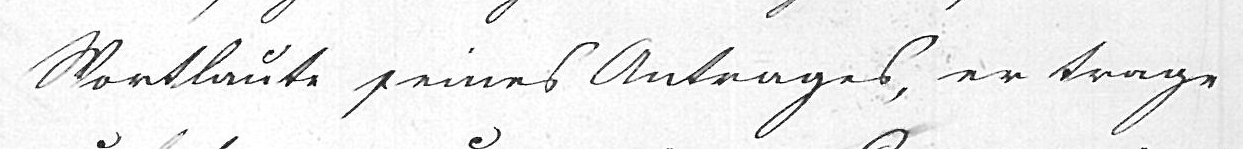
Wortlaute seines Antrages, er trage
